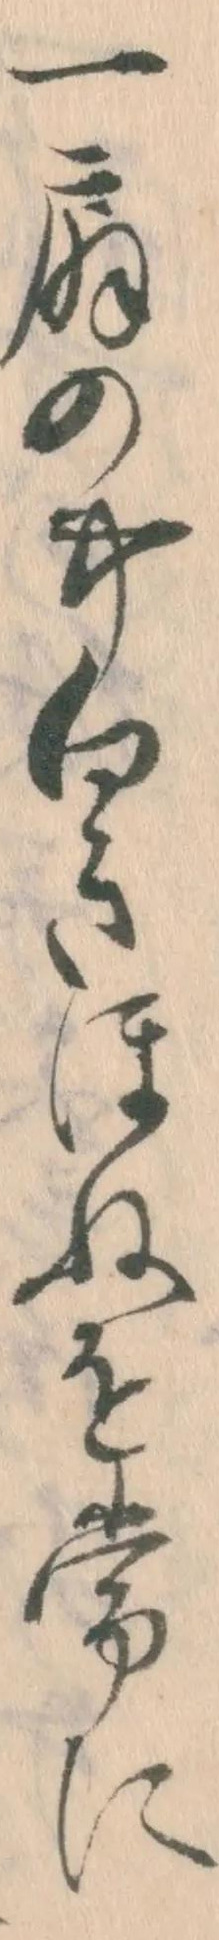一扇の事白きほねを常に
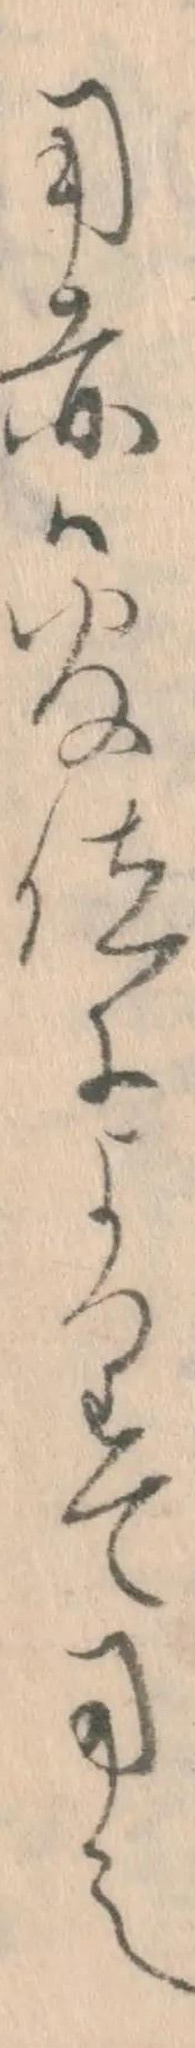用赤ハ官位によりて用之
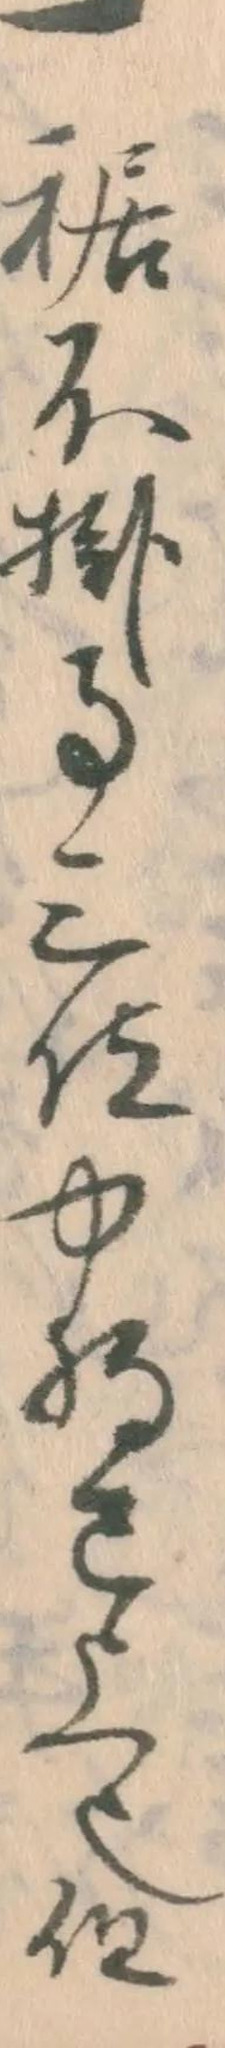一裾不掛事三位中将已上也但
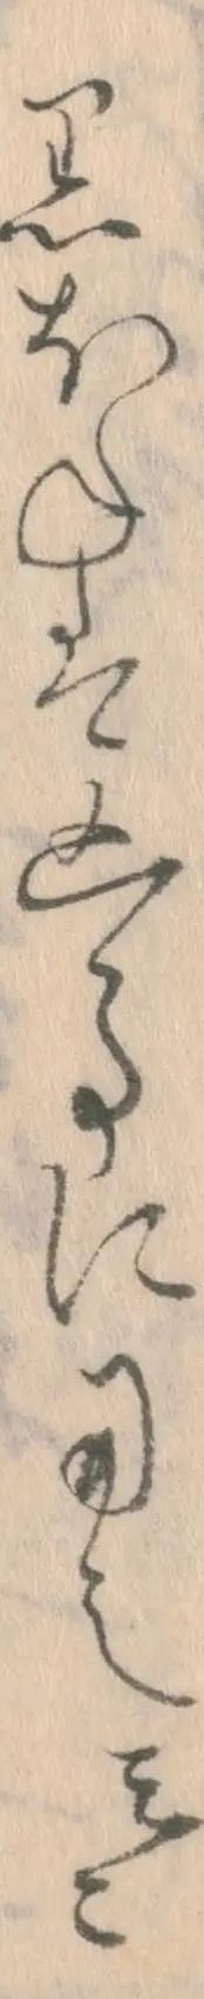黒ほねは凶事に用之云々
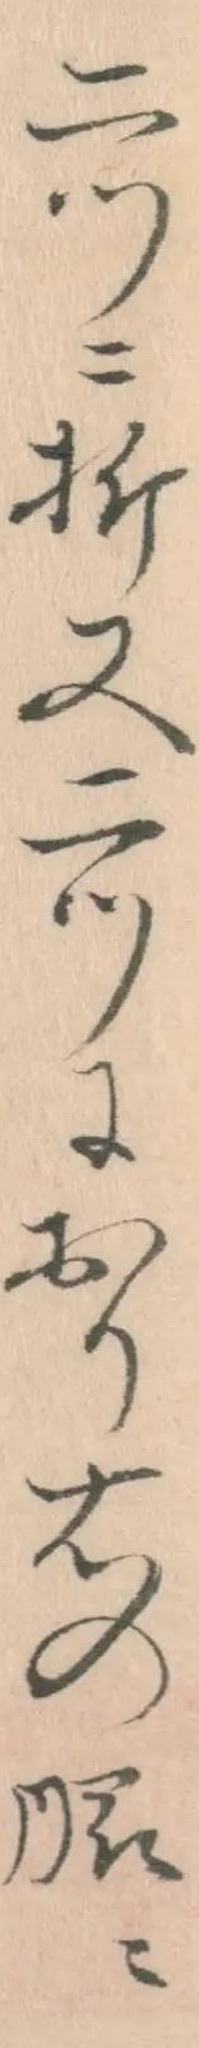二ツ折又二ツにおり右の脇ニ
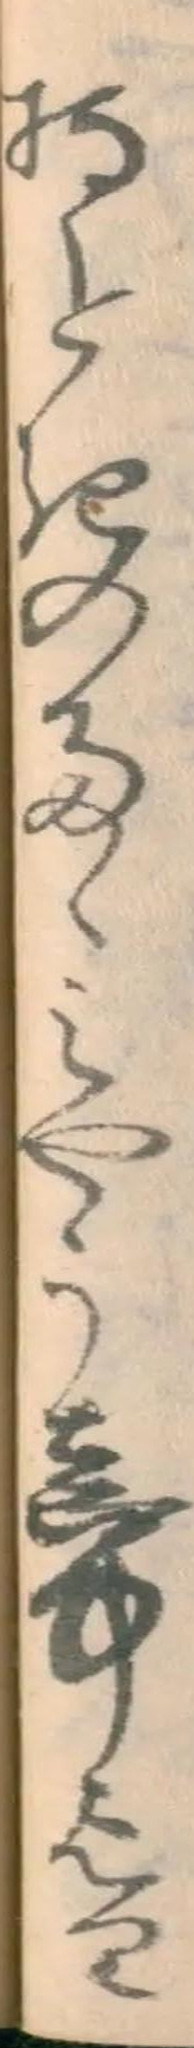持ときのたゝみやう真中より
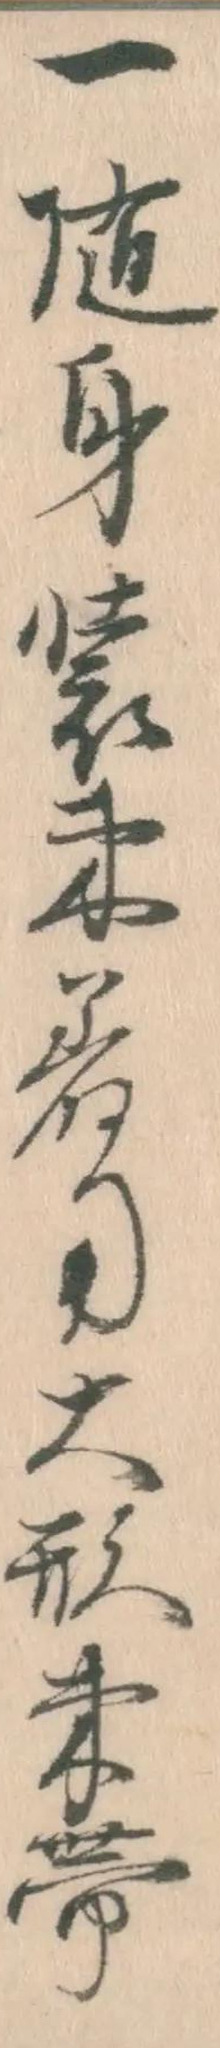一随身装束着用大形束帯
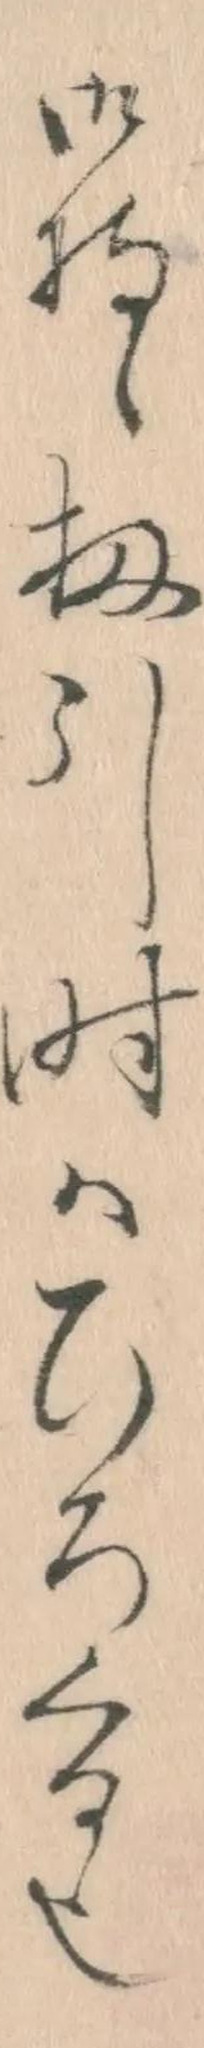御持候扨引時ハひろくる也
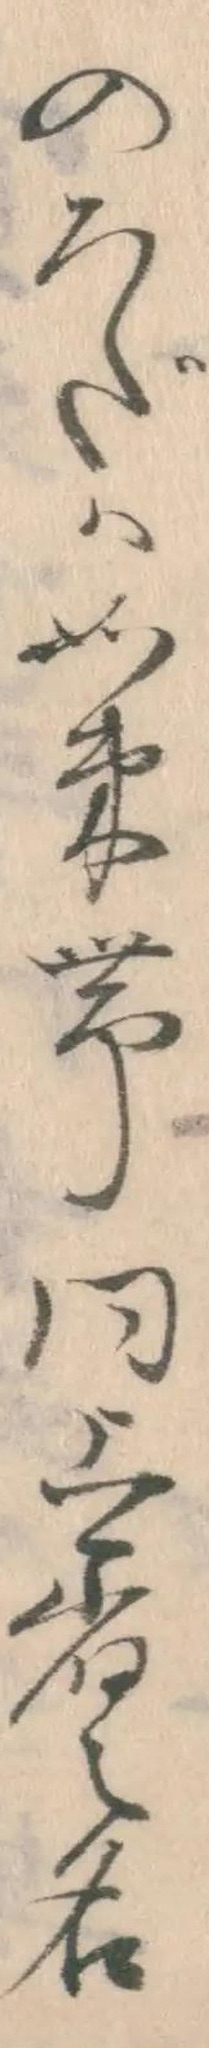のひだハ如束帯同上着之名
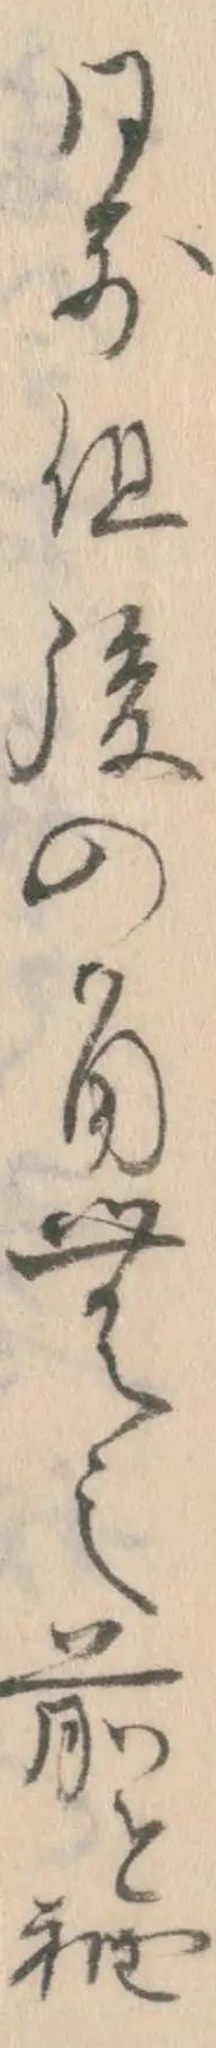同前但綾の角無之前と袖
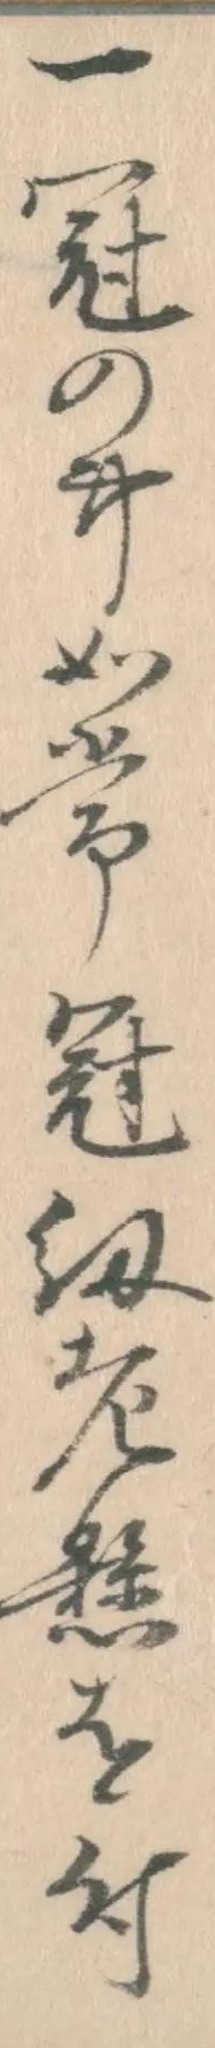一冠の事如常冠紐老懸を付
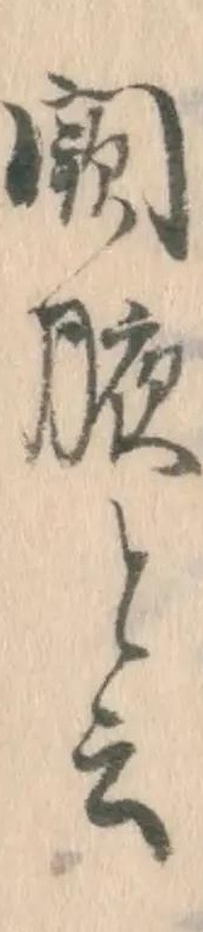闕腋と云
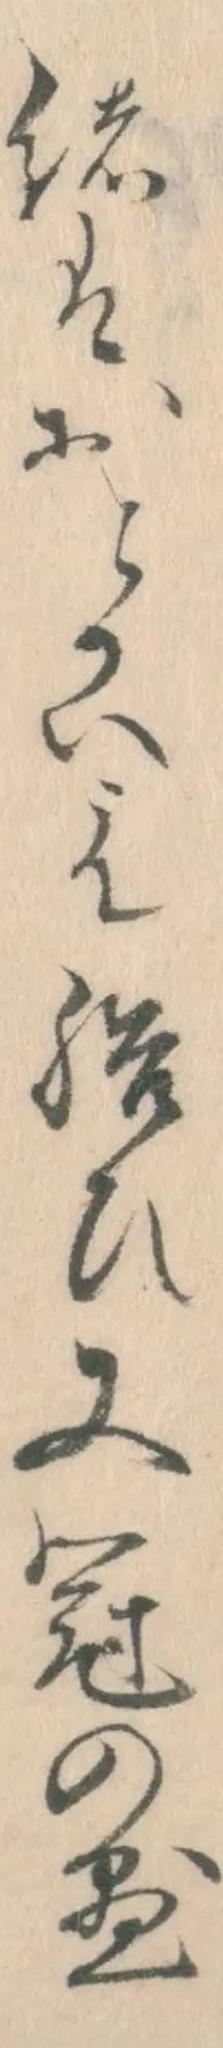緒はおとかいニて結ひ又冠の懸
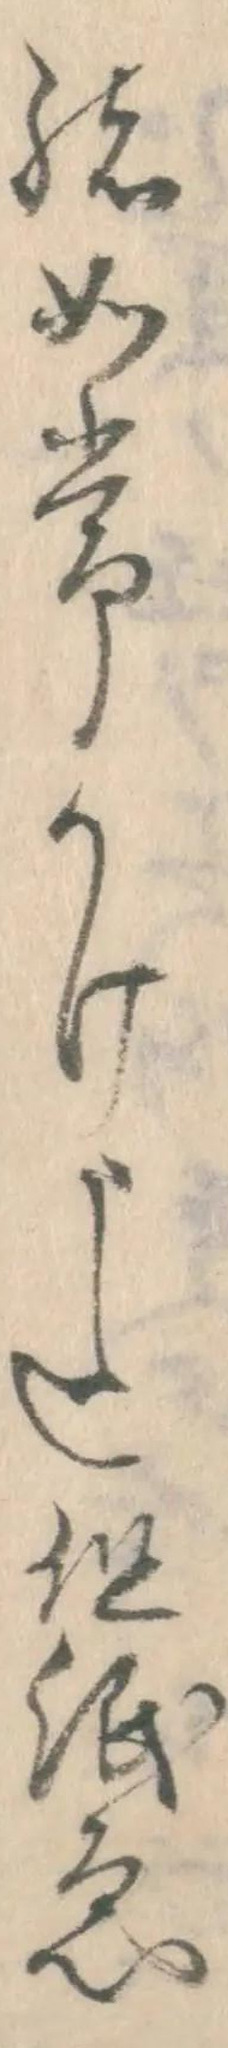緒如常かけ申也但紙ゑ
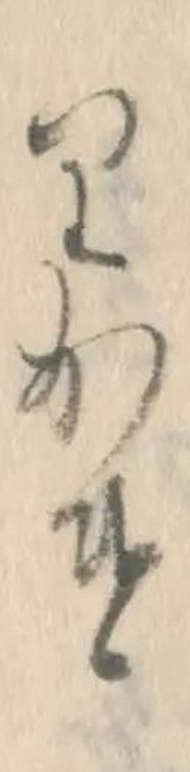りかけ

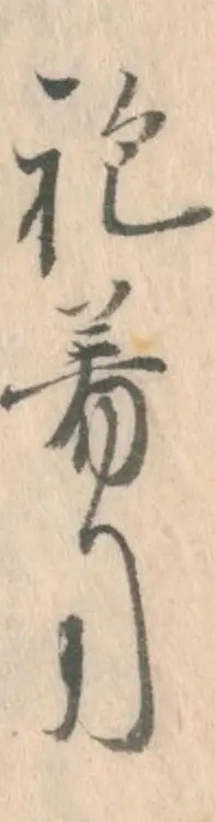袍着用
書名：賀茂社記録. 第80冊
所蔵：国立国会図書館 National Diet Library, JAPAN
